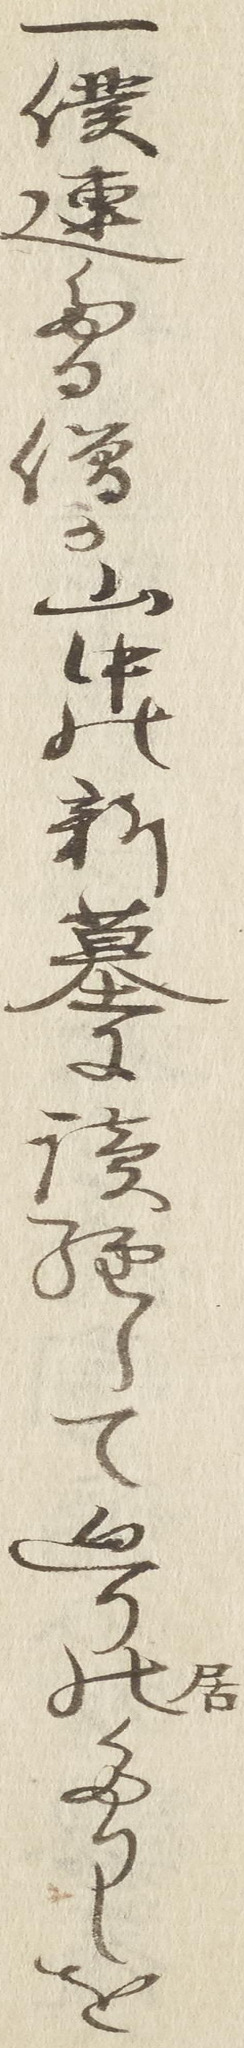一僕連たる僧か山中の新墓に読経して廻りのたりしを
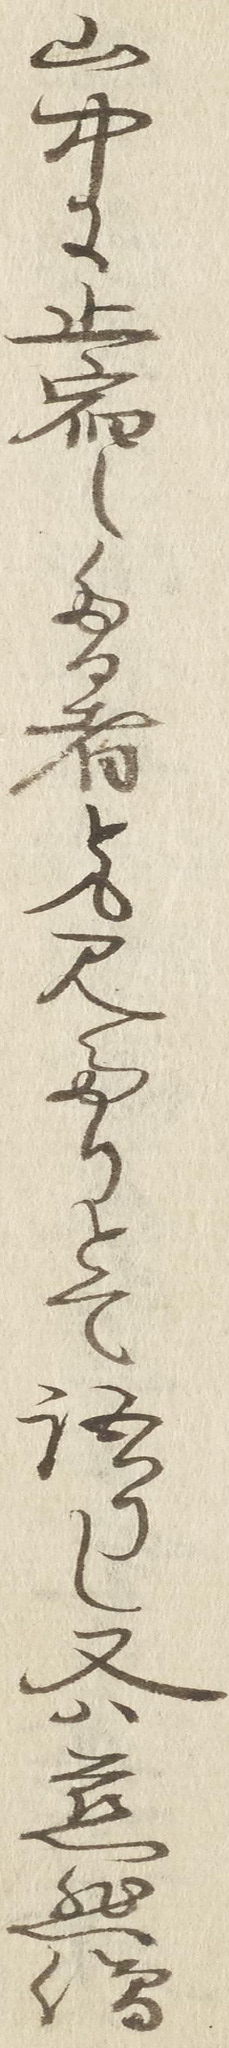山中に止宿したる者とも見たりとて語りし又ハ慈悲僧
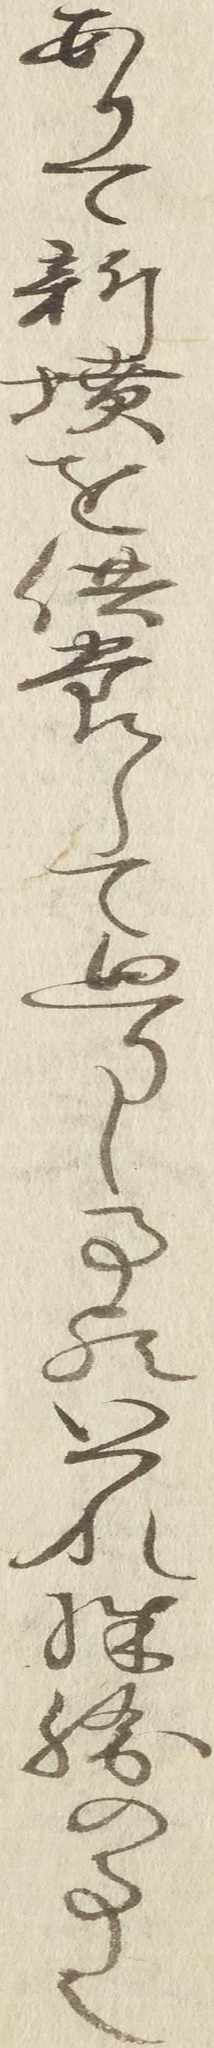ありて新墳を供養して廻りし事歟いつれ殊勝の事也
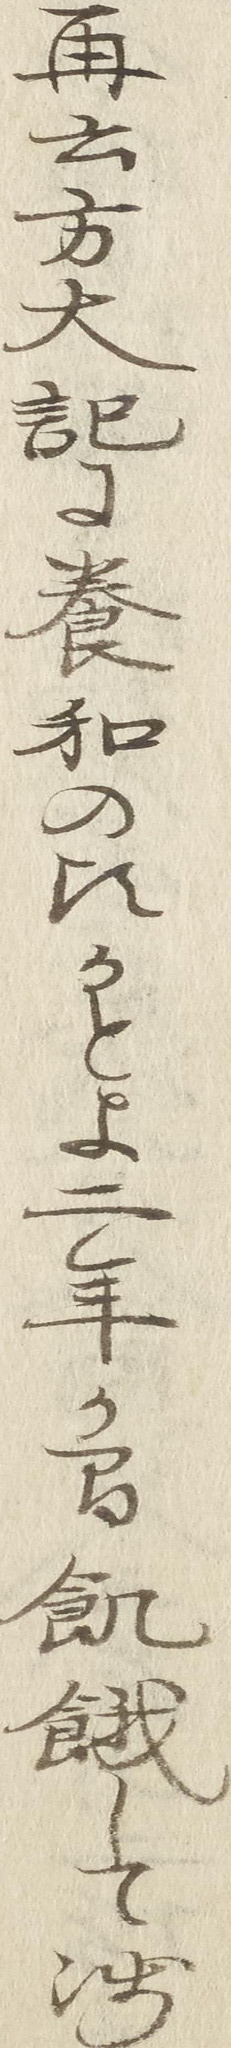再云方丈記に養和の頃かとよ二年か間飢餓して浅
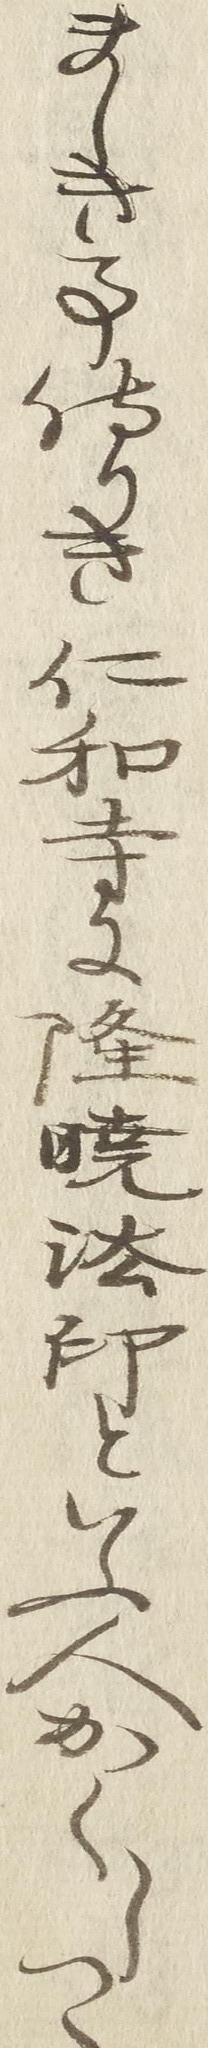ましき事侍りき仁和寺に隆暁法印といふ人かくしつゝ
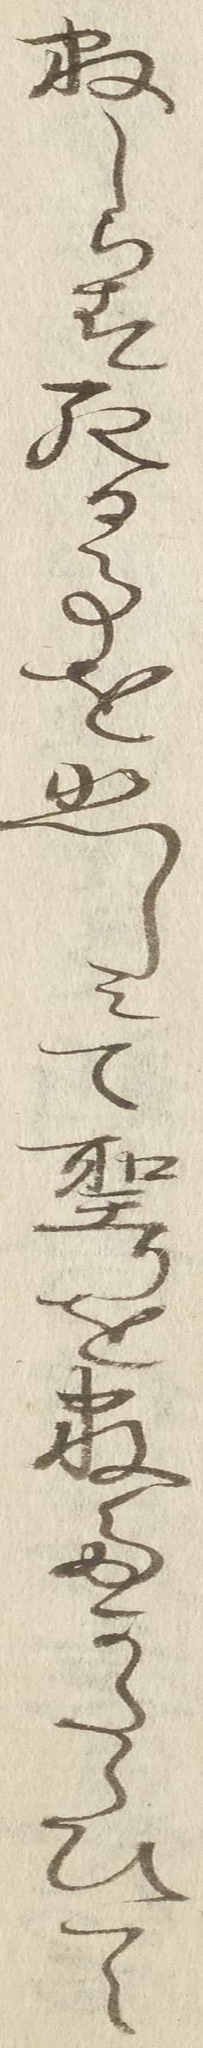数しらす死る事を悲しミて聖りを数多かたらひて
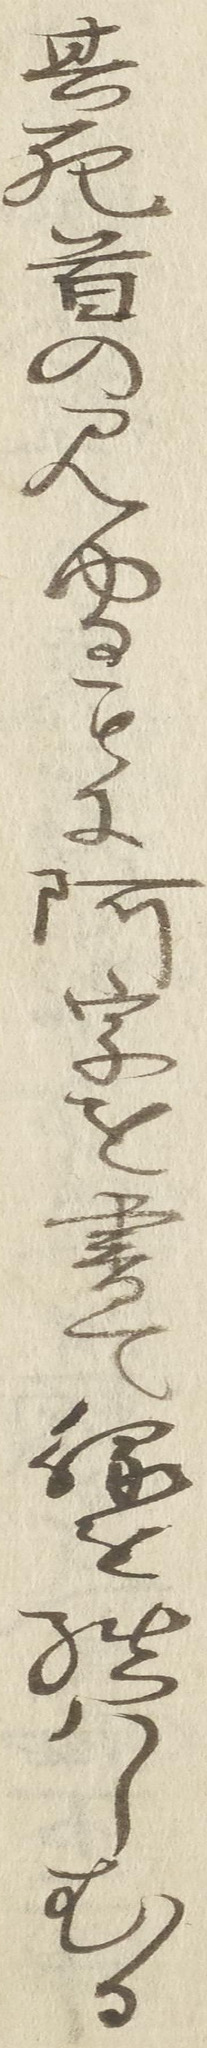其死首の見ゆることに阿字を書て縁を結ハしむる
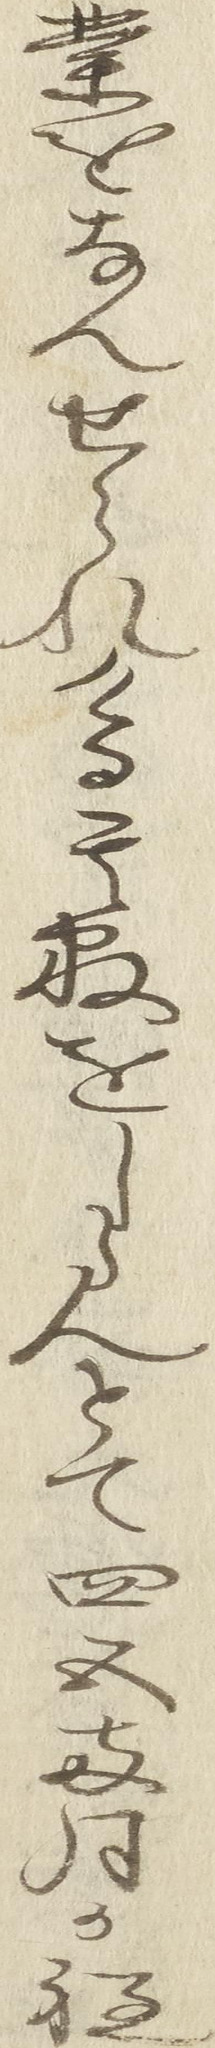業をなんせられける其数をしらんとて四五両月か程

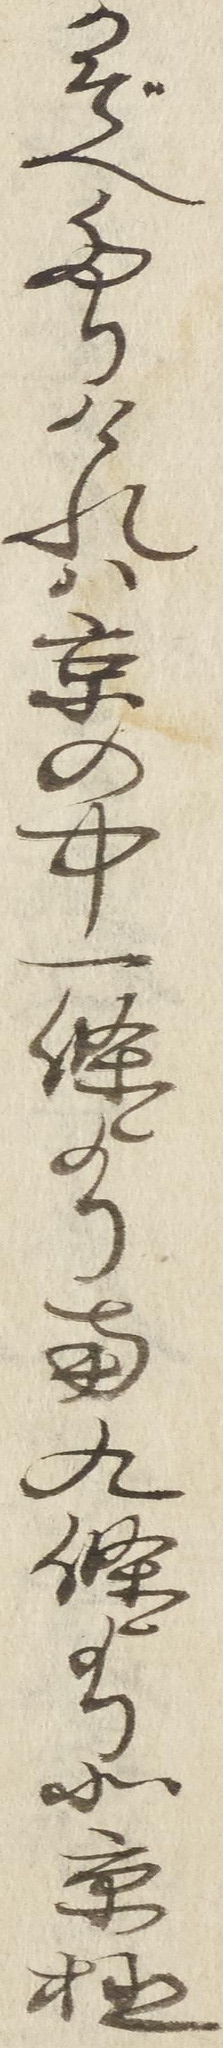かぞへたりけれハ京の中一條より南九條より北京極
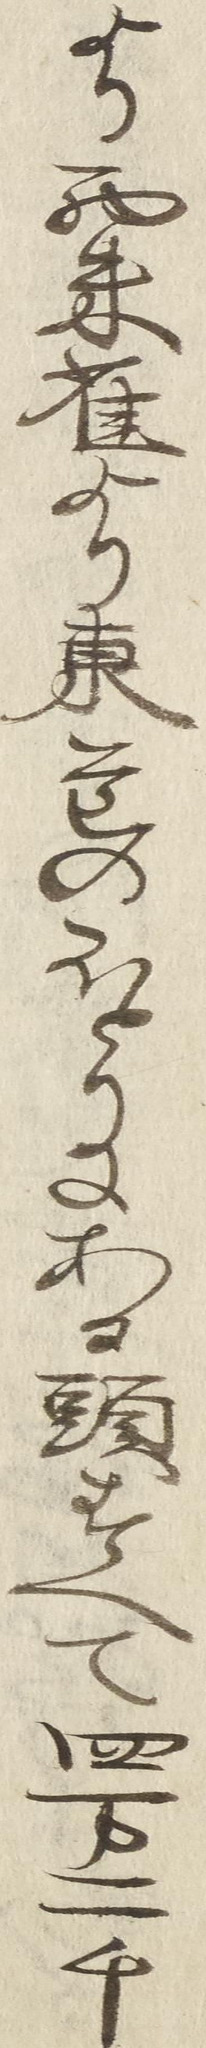より西朱雀より東道のほとりにある頭すへて四万二千
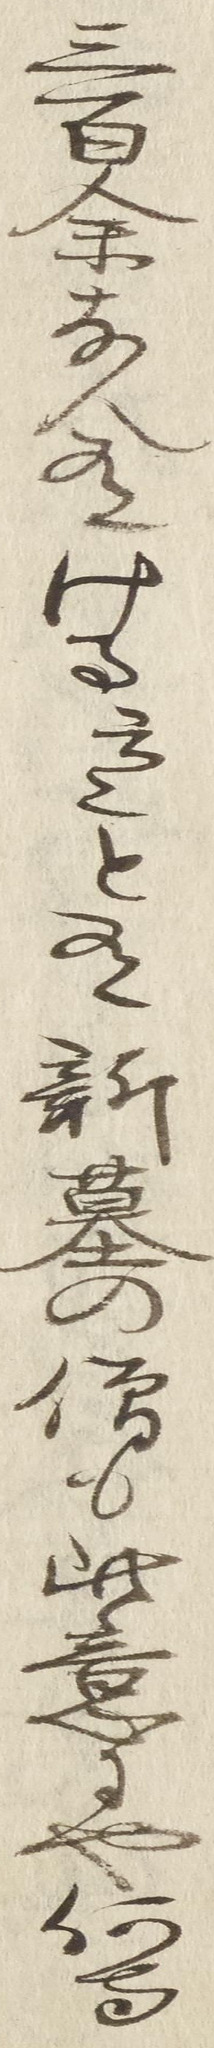三百余なん有ける云々と有新墓の僧も此意にや何寺
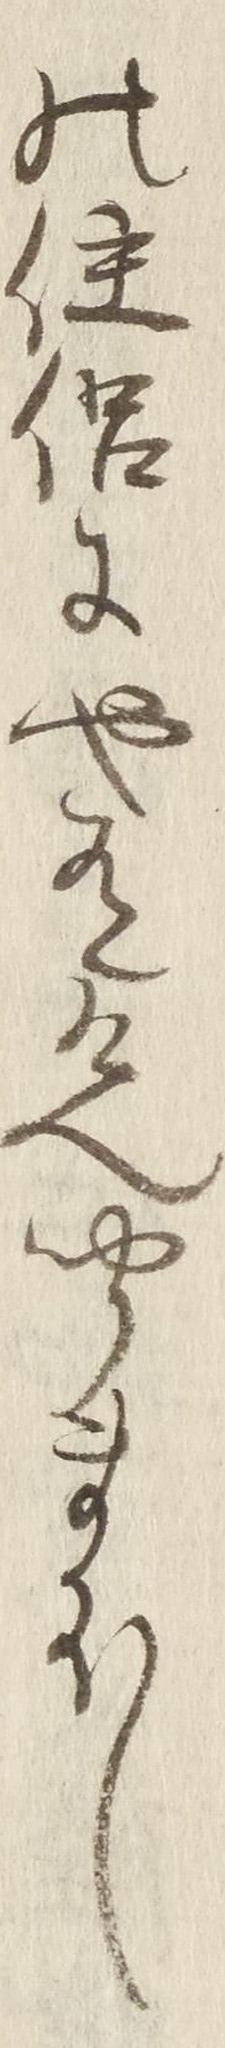の住侶にや有けん聞まほし
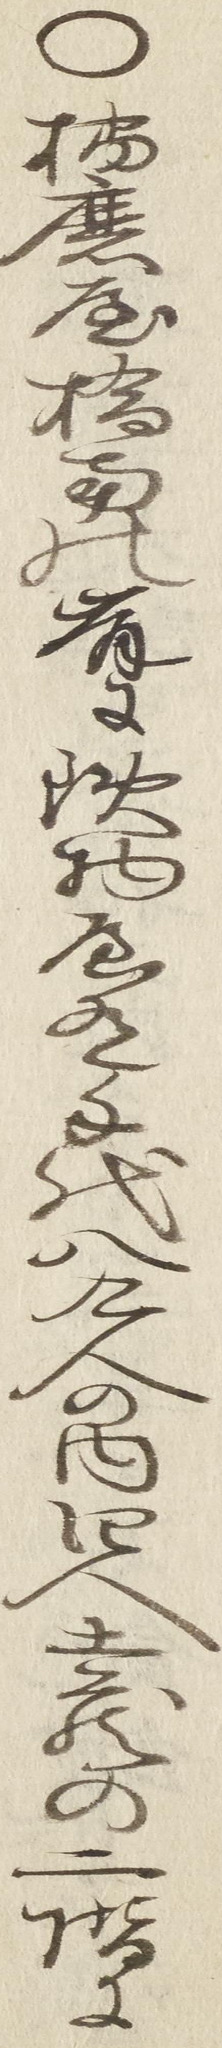○播磨屋橋南の岸に鋏物屋有手代八九人の内四人土蔵の二階に
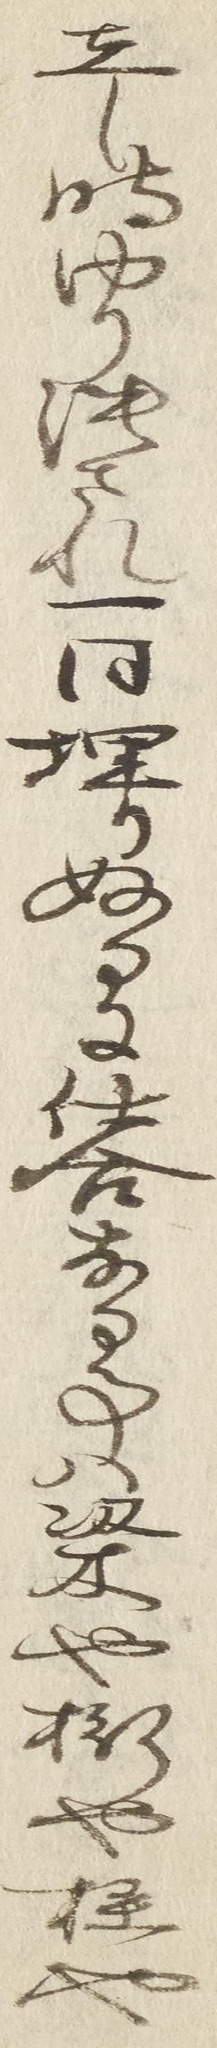在し時ゆり潰され一同埋りぬるに仕合なる事ハ梁や桁や柱や
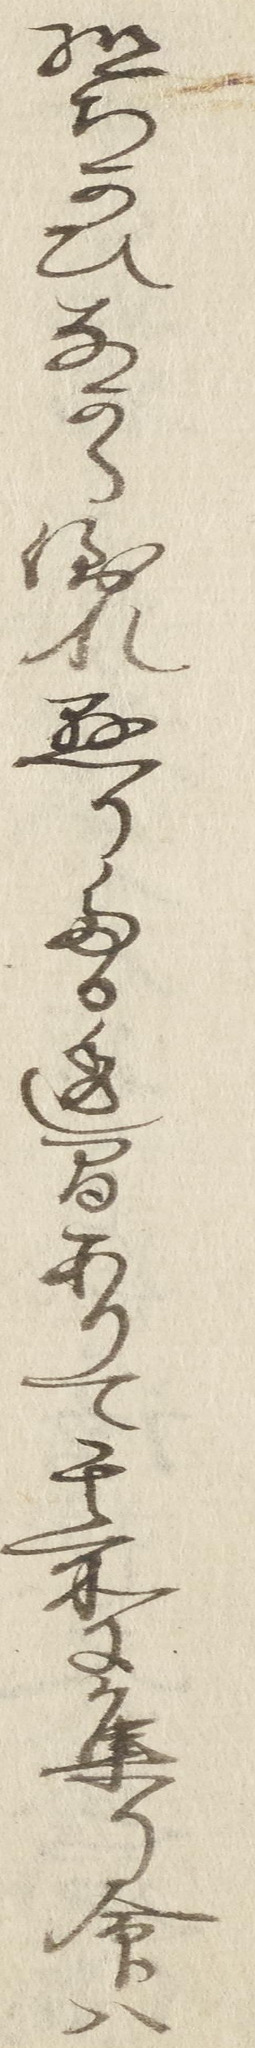組ちかひなから倒れ懸りたる透間ありて其所に集り命ハ
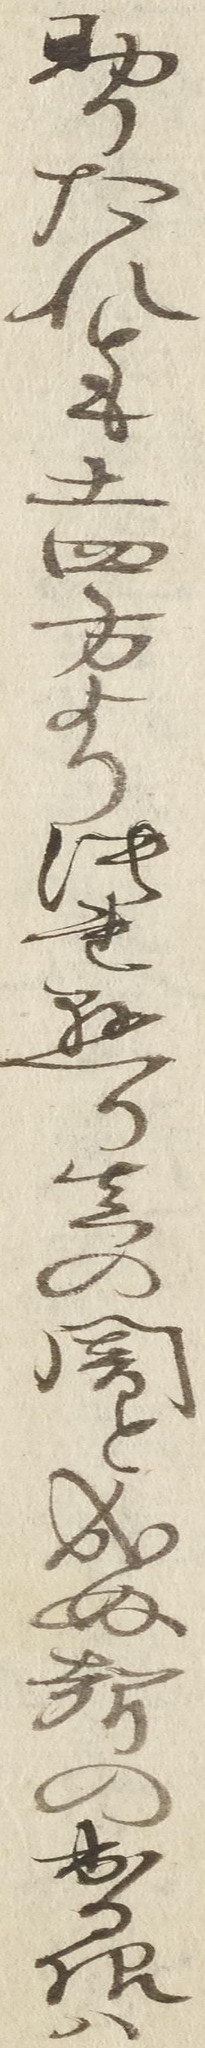助りたれとも土四方より潰れ懸り真の闇と成ぬ聲の出る限ハ
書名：地震記　上
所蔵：東京大学地震研究所図書室 Earthquake Research Institute Library, The University of Tokyo, JAPAN
